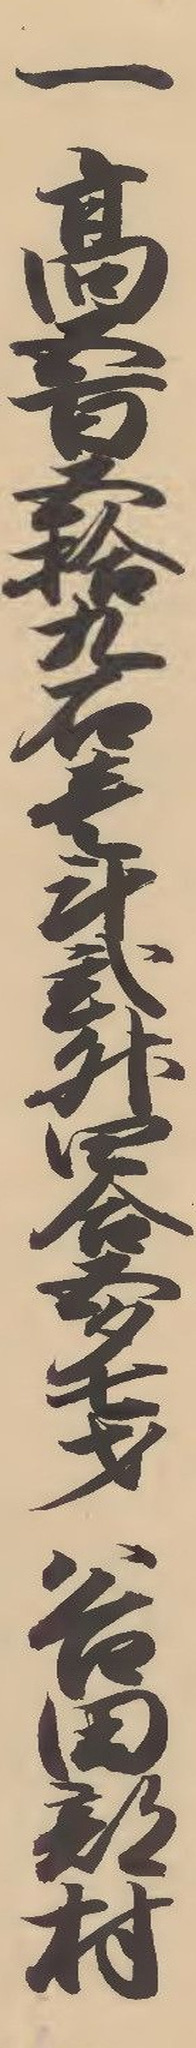一高五百五拾九石壱斗弐升四合五勺七才谷田部村
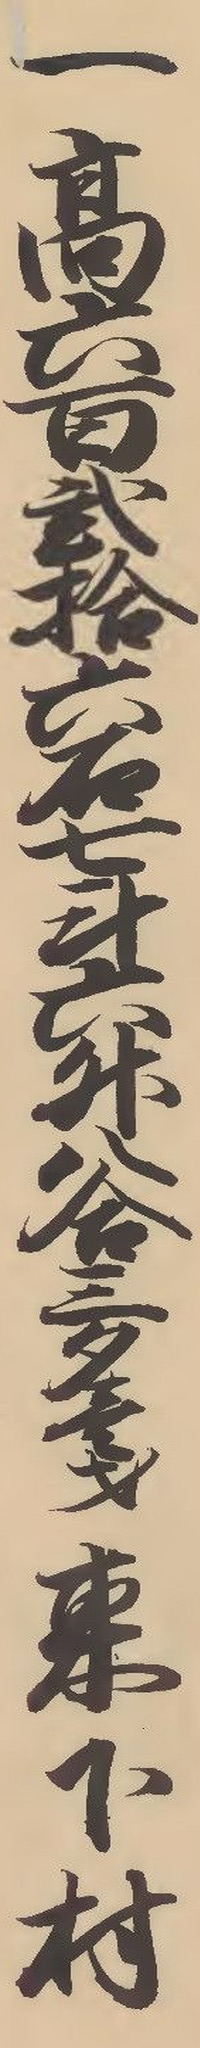一高六百弐拾六石七斗六升八合三勺壱才東下村
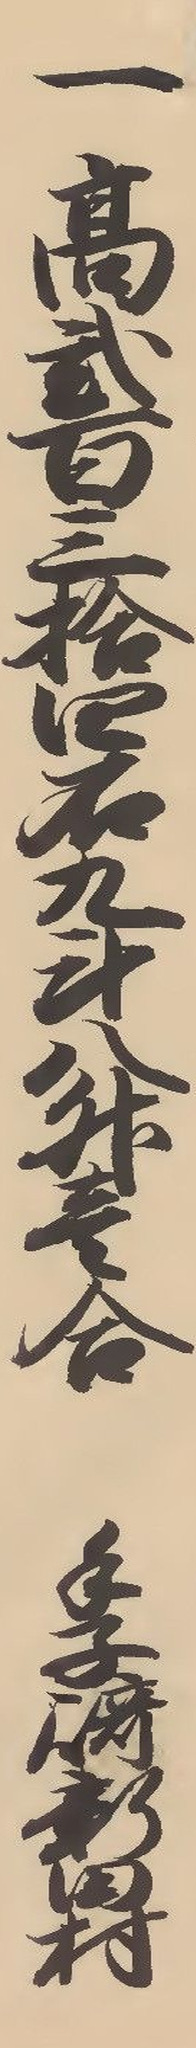一高弐百三拾四石九斗八升壱合手子崎新田村
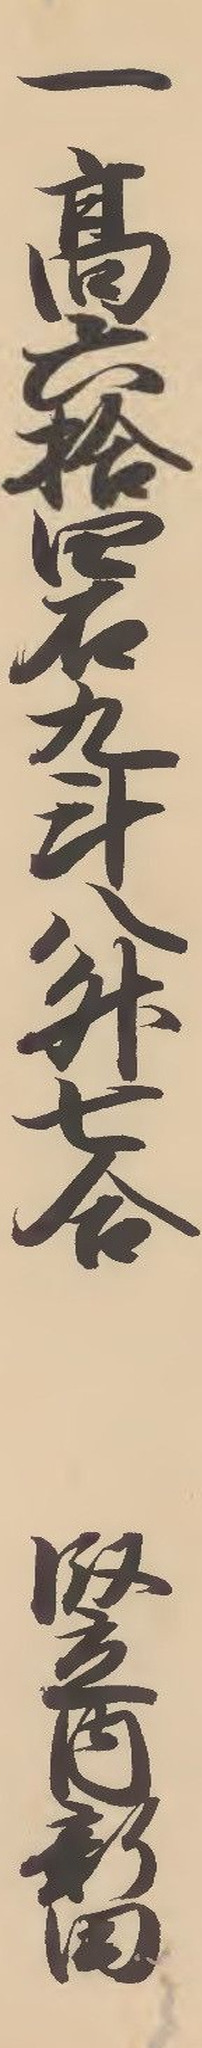一高六拾四石九斗八升七合堅内新田
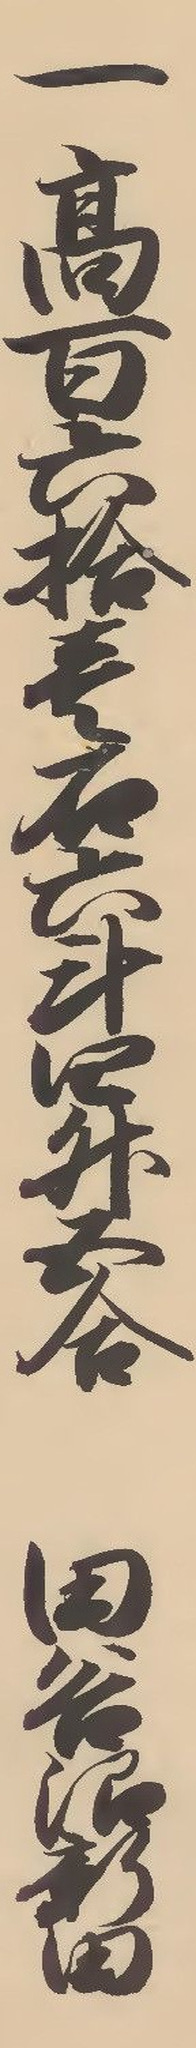一高百六拾壱石六斗四升五合田谷沼新田
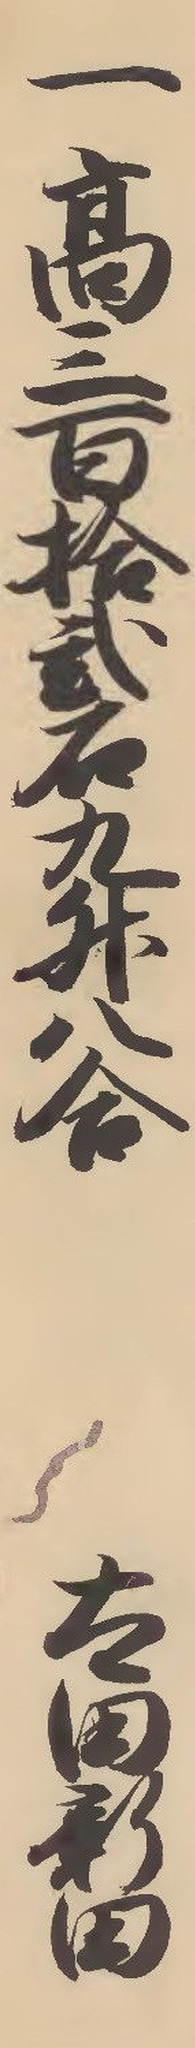一高三百拾弐石九升八合太田新田

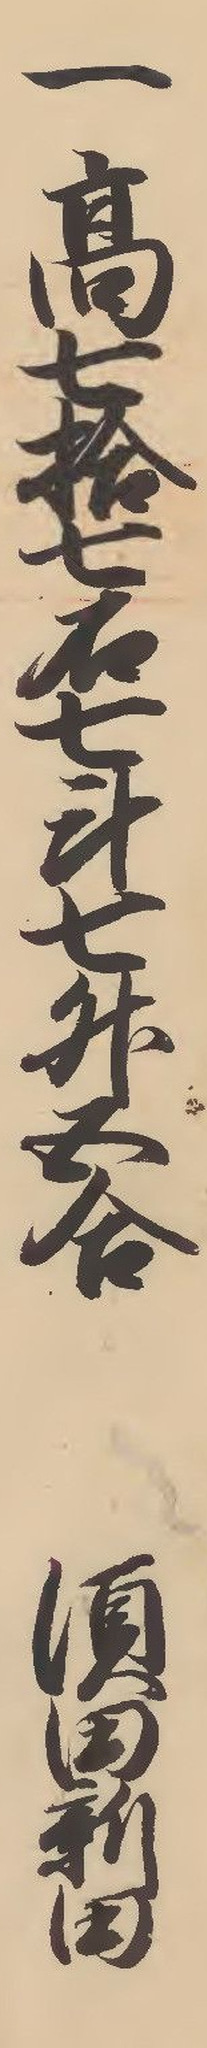一高七拾七石七斗七升五合須田新田
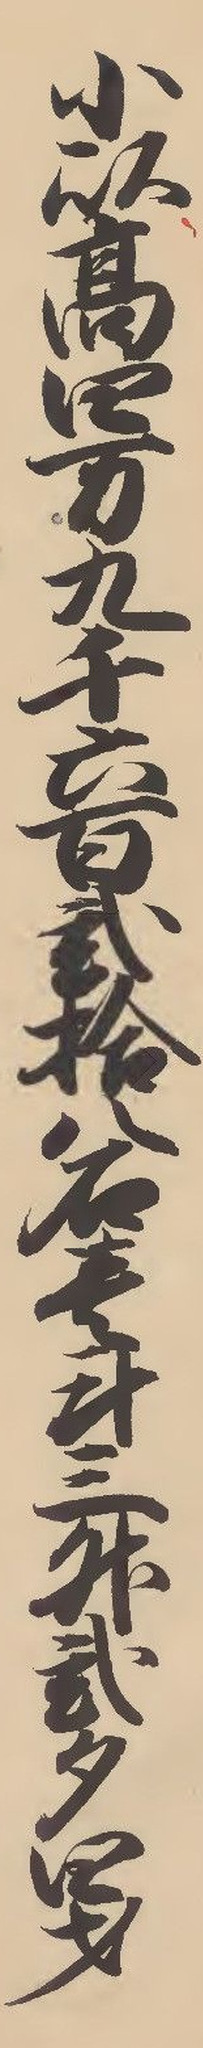小以高四万九千六百弐拾八石壱斗三升弐勺四才
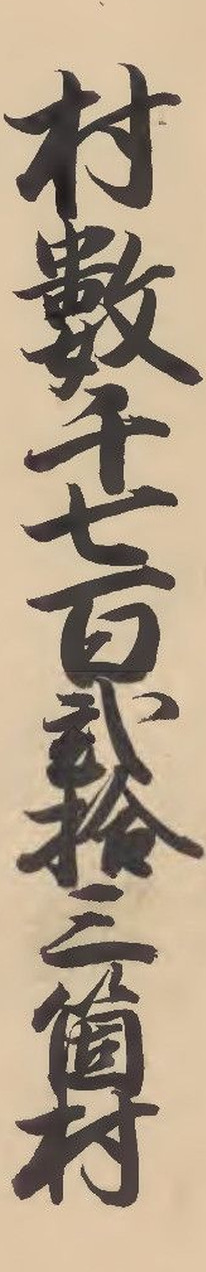村数千七百弐拾三箇村
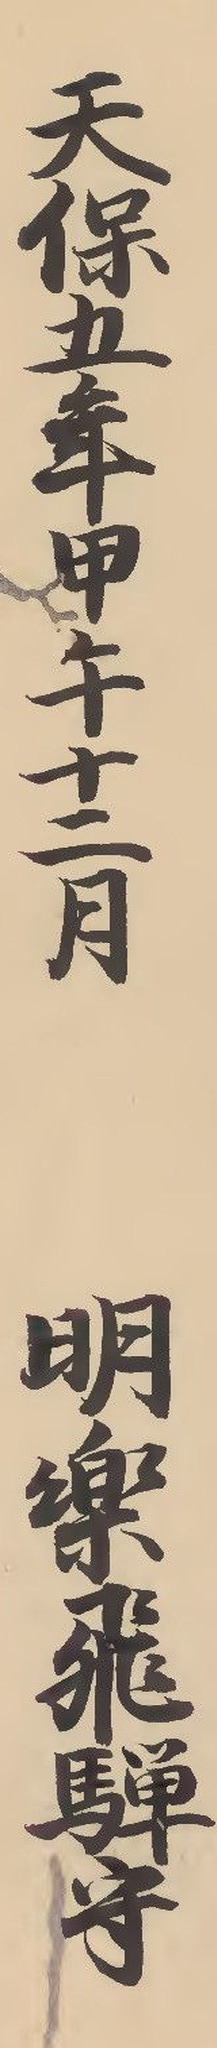天保五年甲午十二月明楽飛騨守
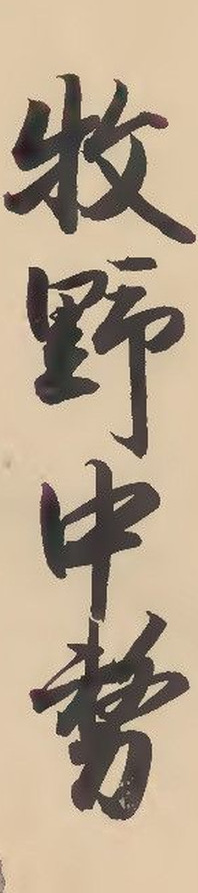牧野中務
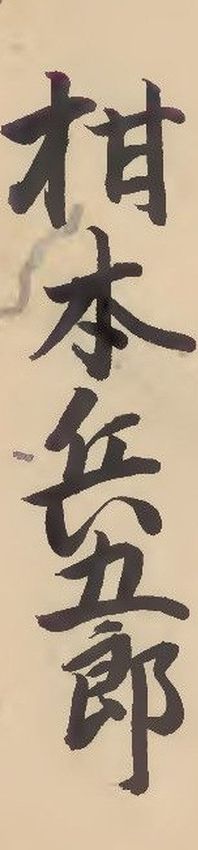柑本兵五郎
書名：常陸国郷帳
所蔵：国立公文書館 National Archives of Japan
